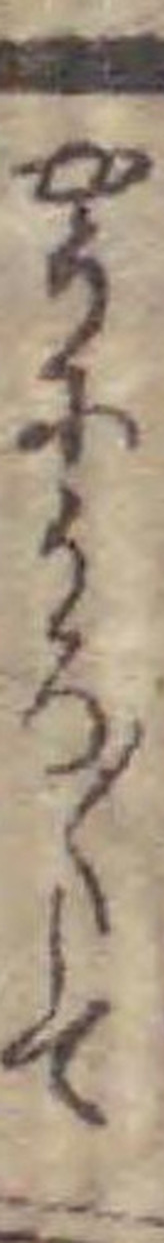やうにうろ〳〵して
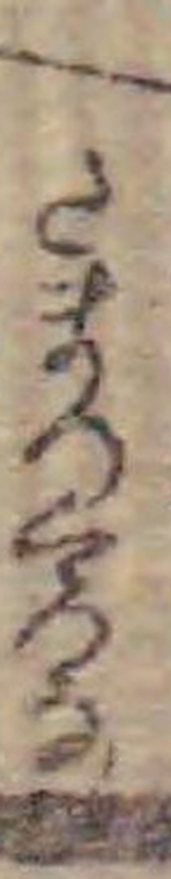たまつくろな
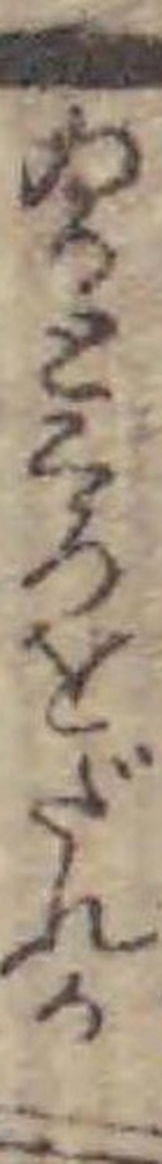ゐるところをだれか
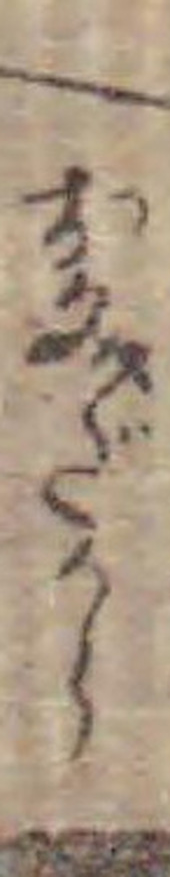お文だから
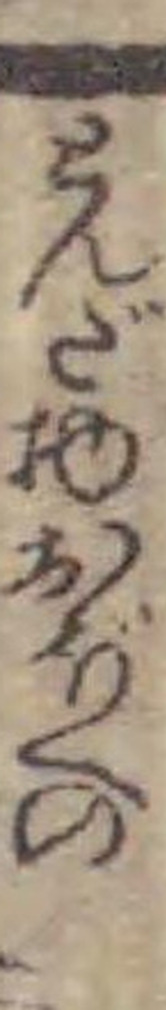とんだ物おぼへの
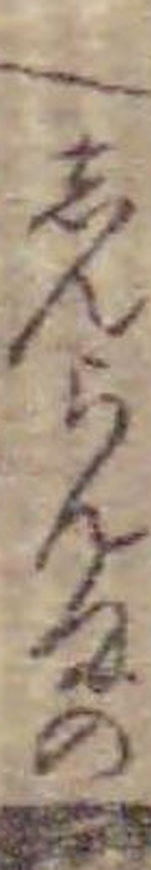しんらんまの
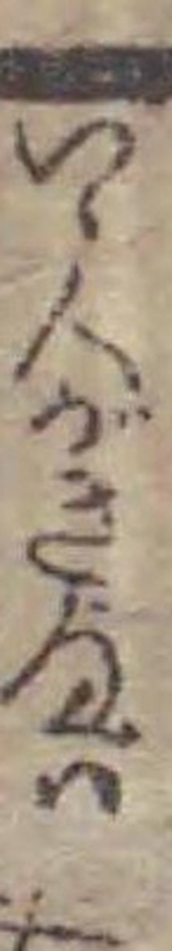いゝ人がきへは
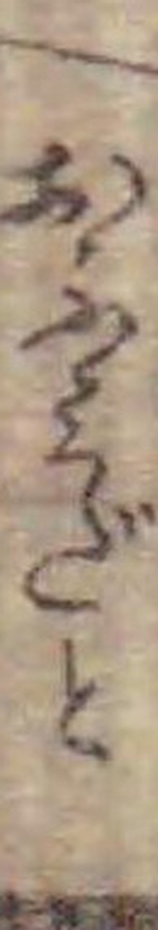おふみだと
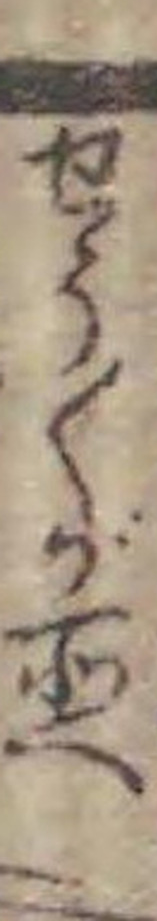せう〳〵が所へ
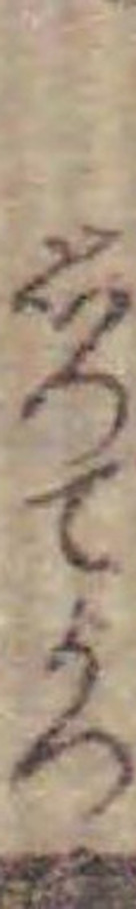思つてよつ
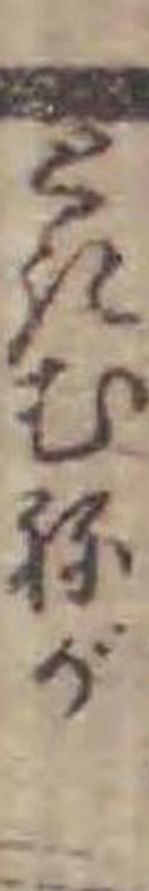ときむねが
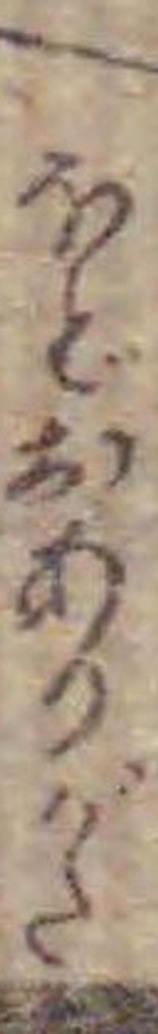ほどおありがた
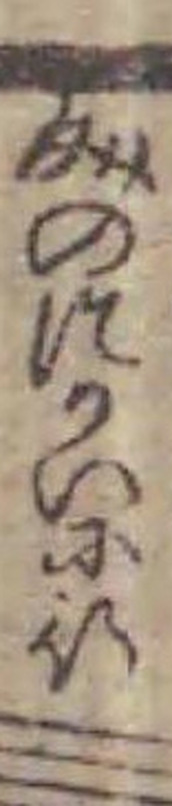文のつかいに行
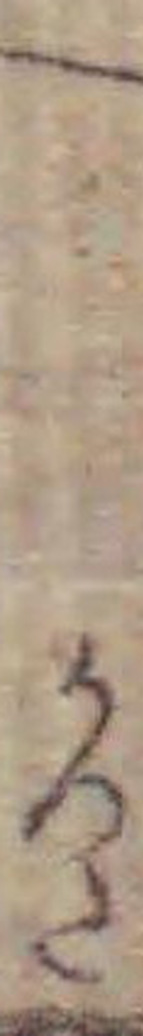かつた
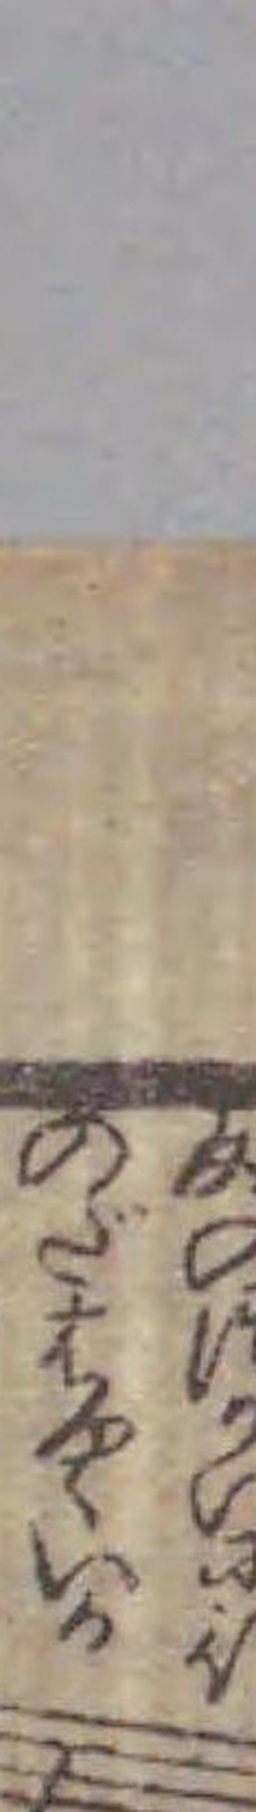のだはやくいか
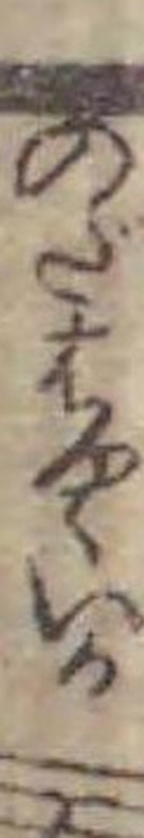のだはやくいか
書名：年寄之冷水曽我 : 3巻
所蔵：国立国会図書館 National Diet Library, JAPAN
